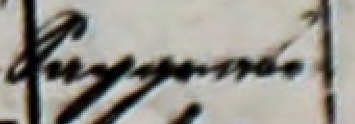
Sapprabe
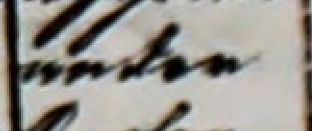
under
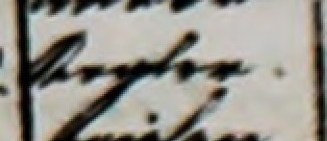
???ter
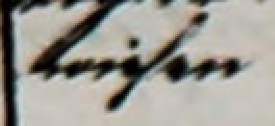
??ichen
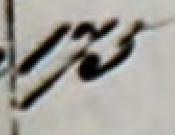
175
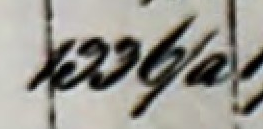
1336/a
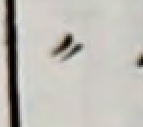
„
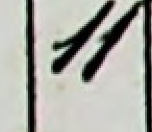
11
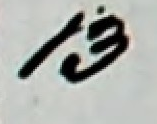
13
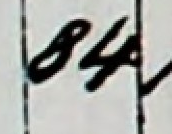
84
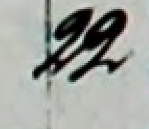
22
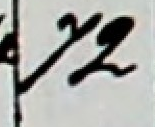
72
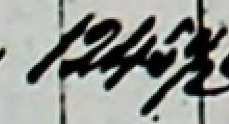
1245 1/2
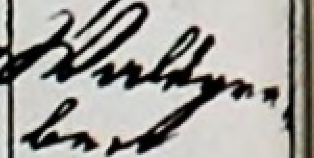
Waldgra„
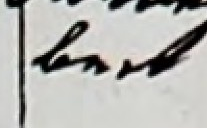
ben
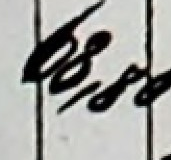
68/8
